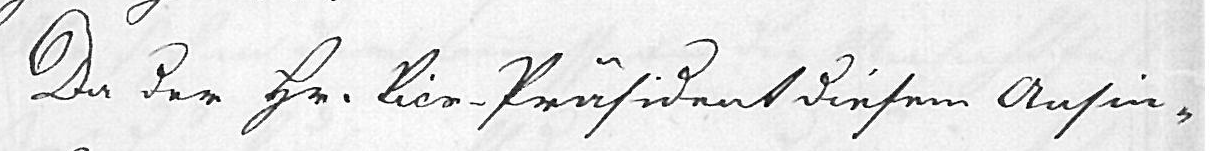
Da der Hr. Vice-Präsident diesem Ansin-
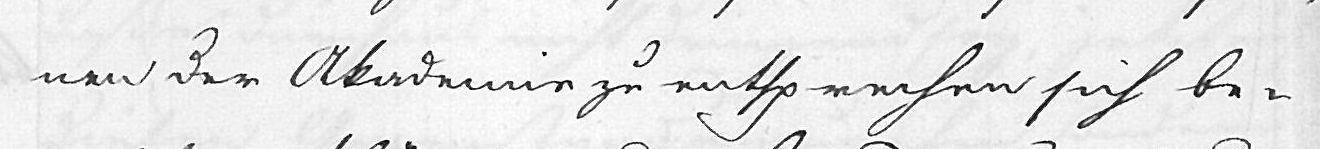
nen der Akademie zu entsprechen sich be-
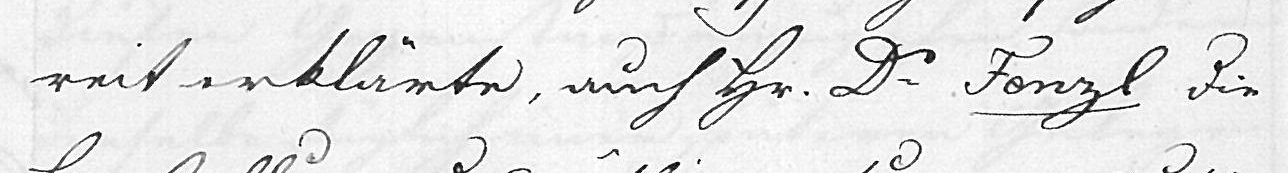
reit erklärte, auch Hr. Dr. Fenzl die
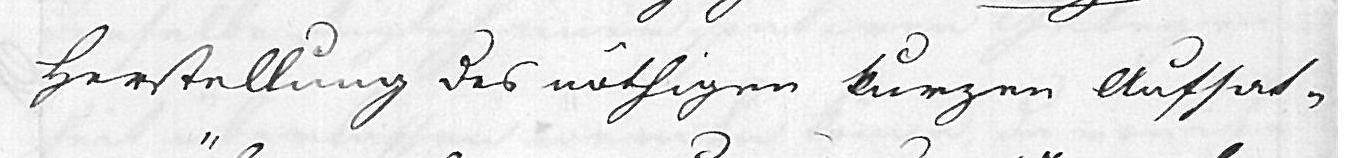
Herstellung des nöthigen kurzen Aufsat-
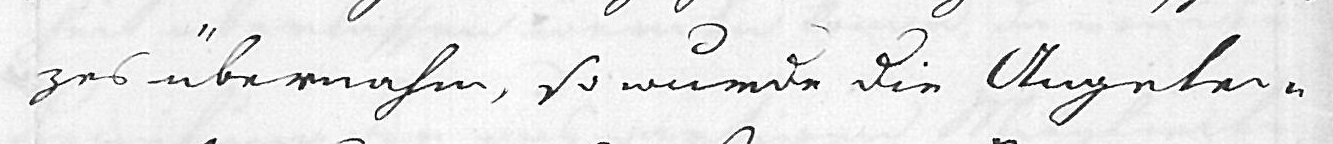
zes übernahm, so wurde die Angele-
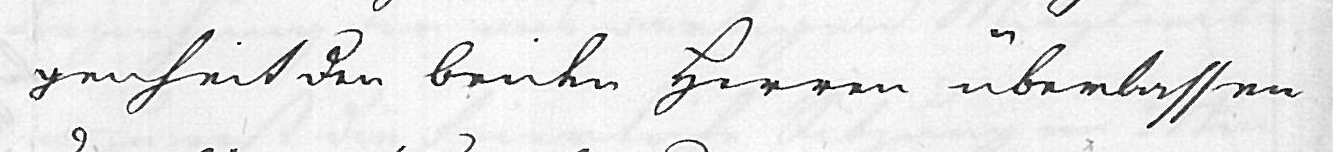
genheit den beiden Herren überlassen
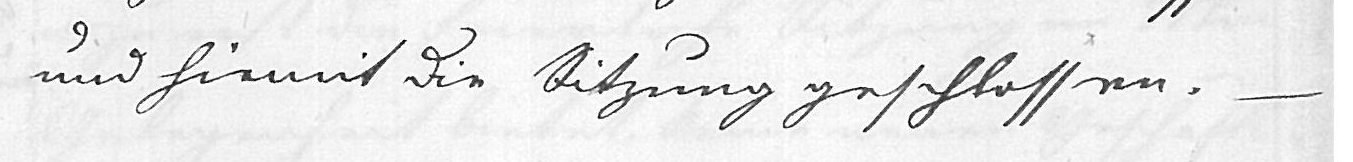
und hiemit die Sitzung geschlossen.
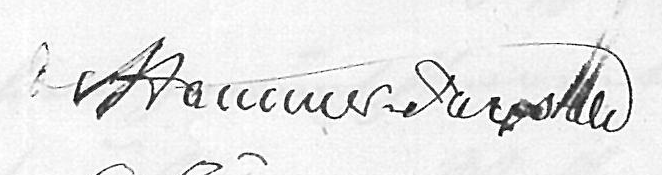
Hammer-Purgstall
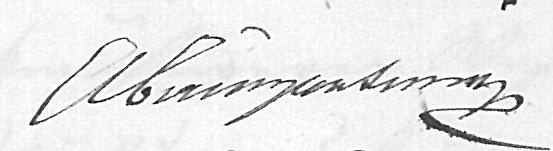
ABaumgartner
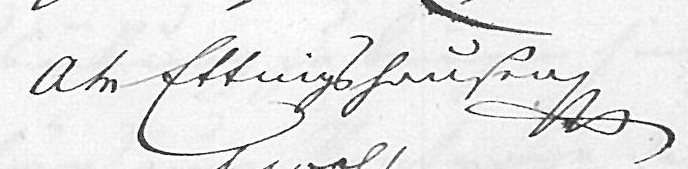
AvEttingshausen
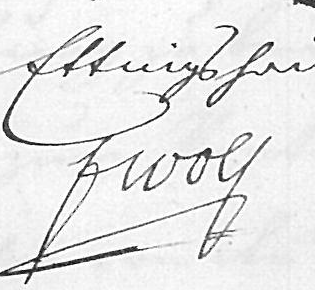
FWolf
